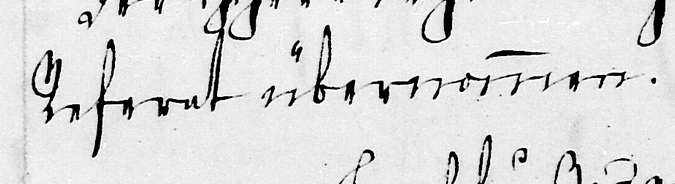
Referat übernommen.
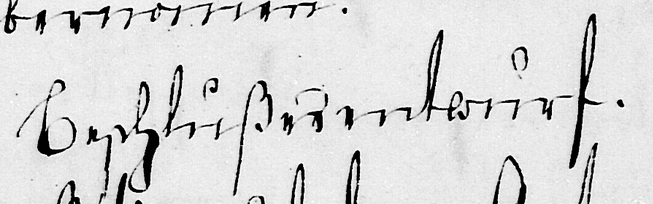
Beschlußesentwurf.
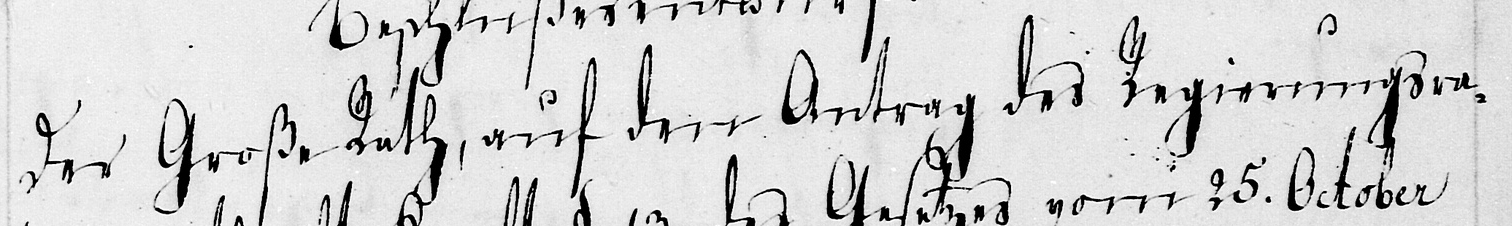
Der Große Rath, auf den Antrag des Regierungsra¬
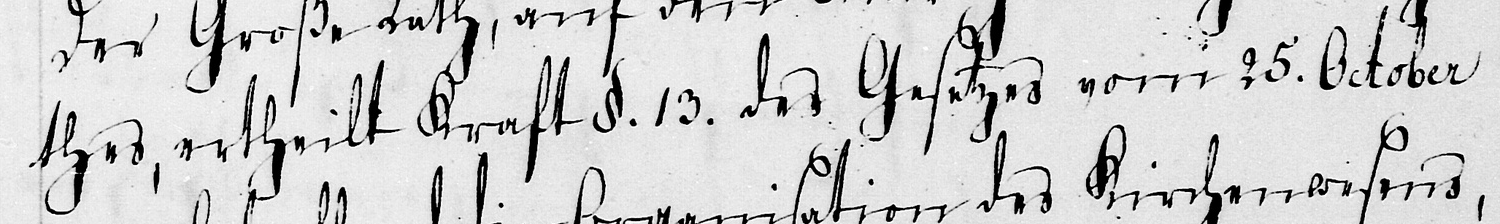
thes, ertheilt Kraft §. 13. des Gesetzes vom 25. October
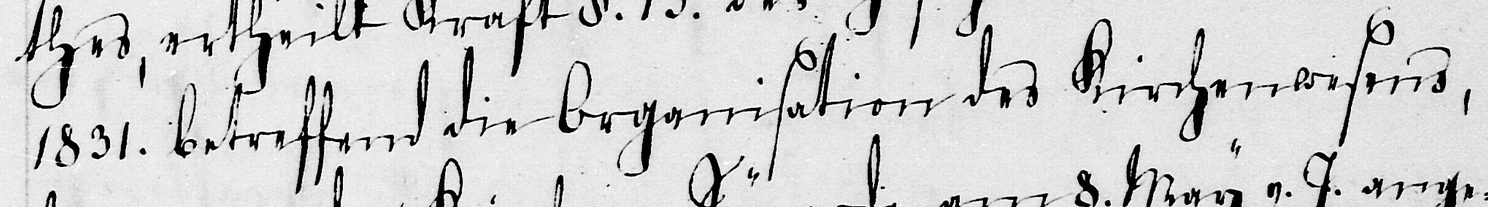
1831. betreffend die Organisation des Kirchenwesens,
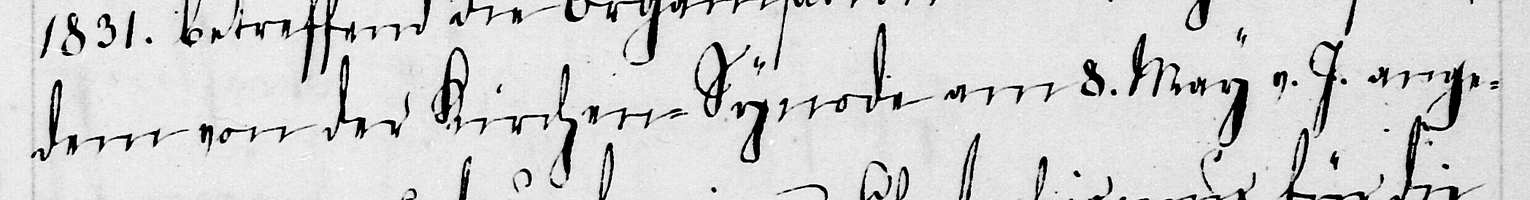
dem von der Kirchen-Synode am 8. May v. J. ange¬
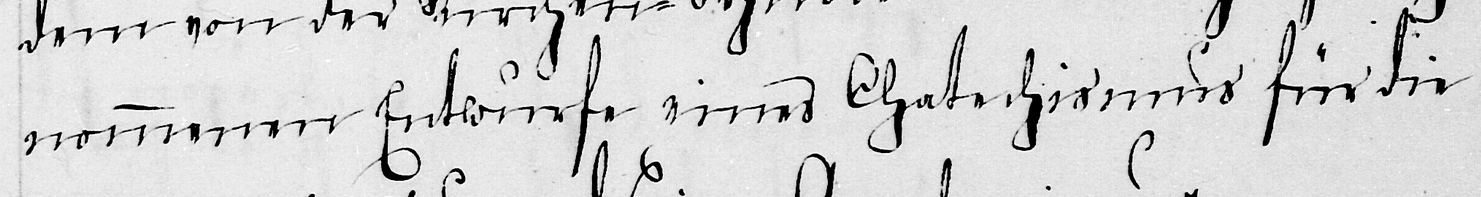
nommenen Entwurfe eines Chatechismus für die
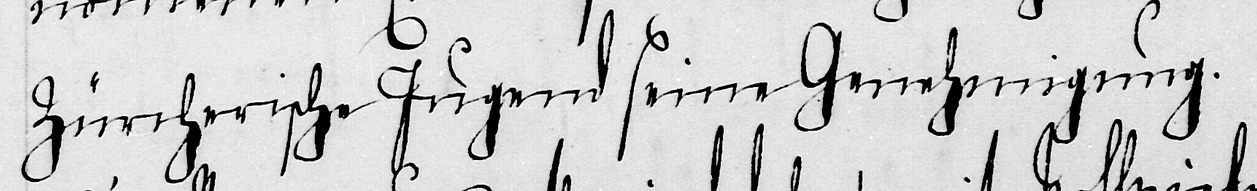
Zürcherische Jugend seine Genehmigung.
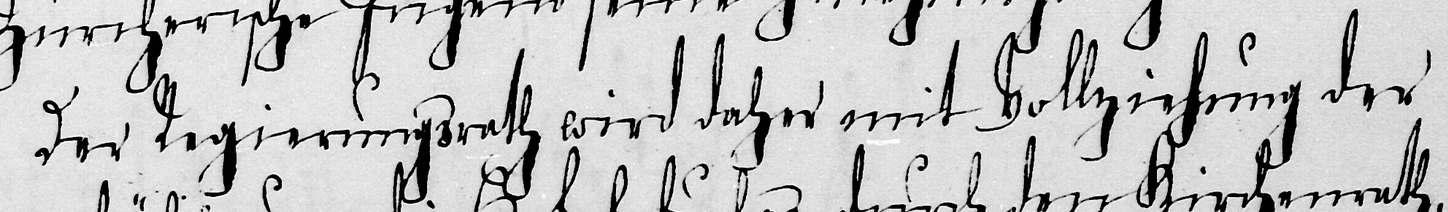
Der Regierungsrath wird daher mit Vollziehung der
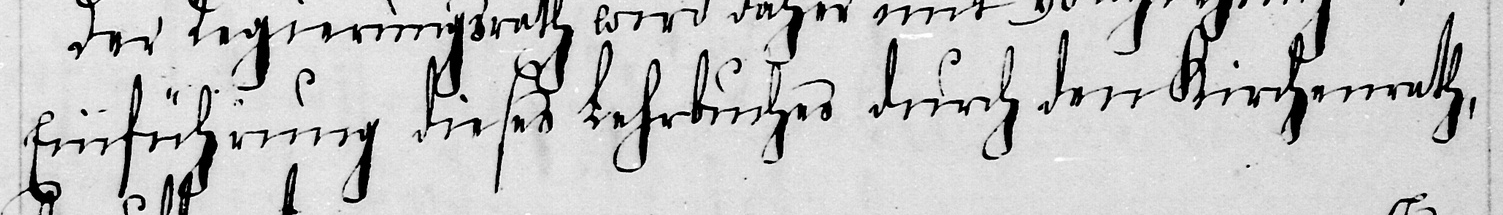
Einführung dieses Lehrbuches durch den Kirchenrath,
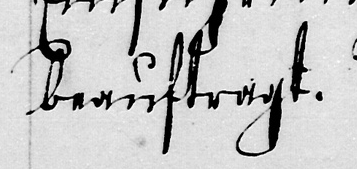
beauftragt.
